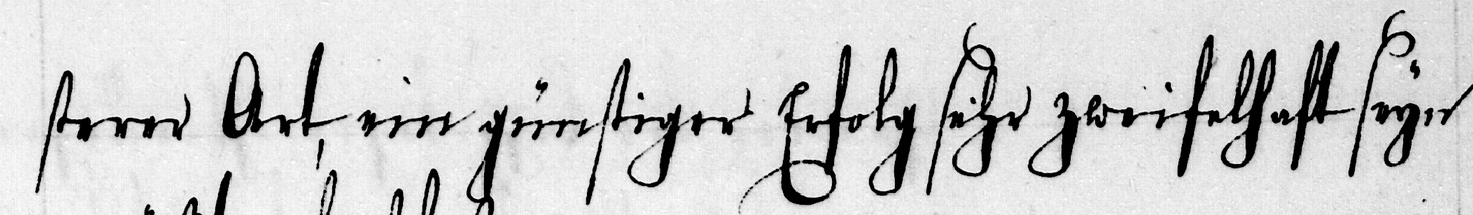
sterer Art, ein günstiger Erfolg sehr zweifelhaft seyn
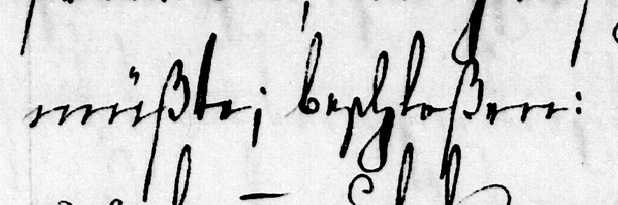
müßte; beschloßen:
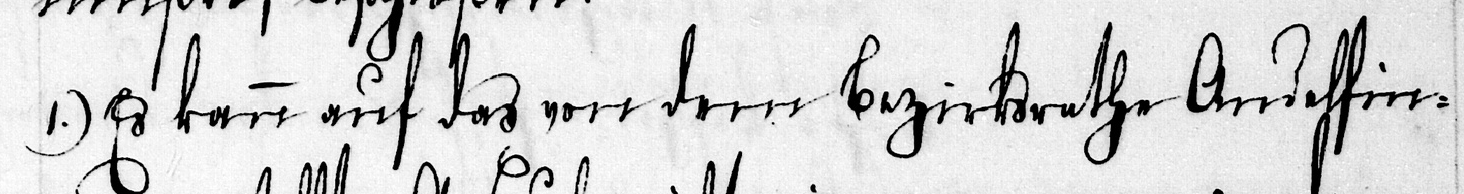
1.) Es kann auf das von dem Bezirksrathe Andelfin¬
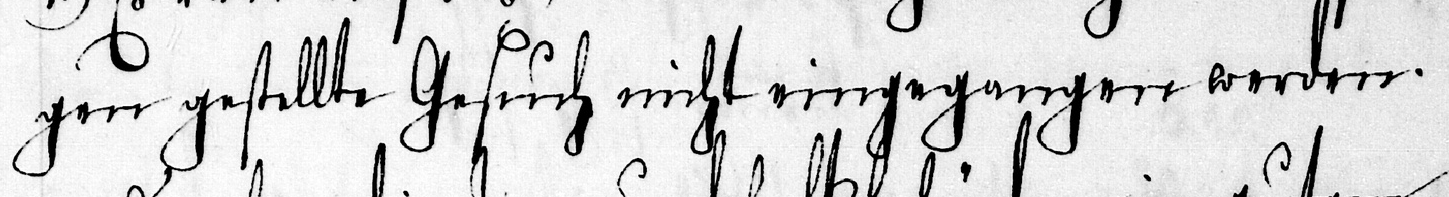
gen gestellte Gesuch nicht eingegangen werden.
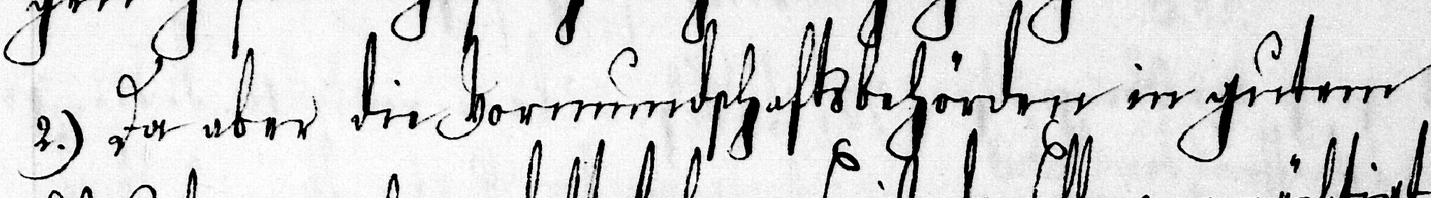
2.) Da aber die Vormundschaftsbehörden in gutem
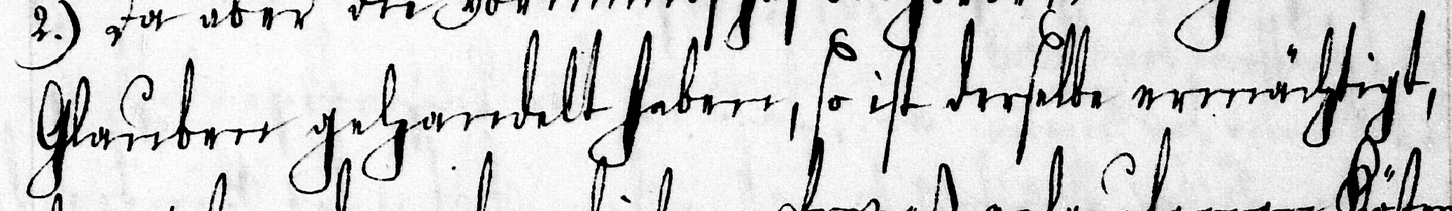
Glauben gehandelt haben, so ist derselbe ermächtigt,
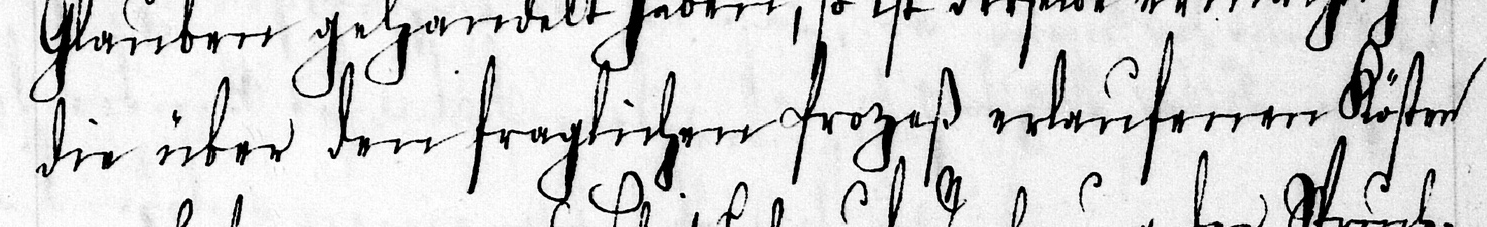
die über den fraglichen Prozeß erlaufenen Kösten
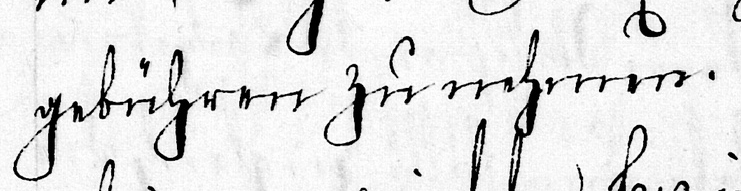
gebühren zu nehmen.
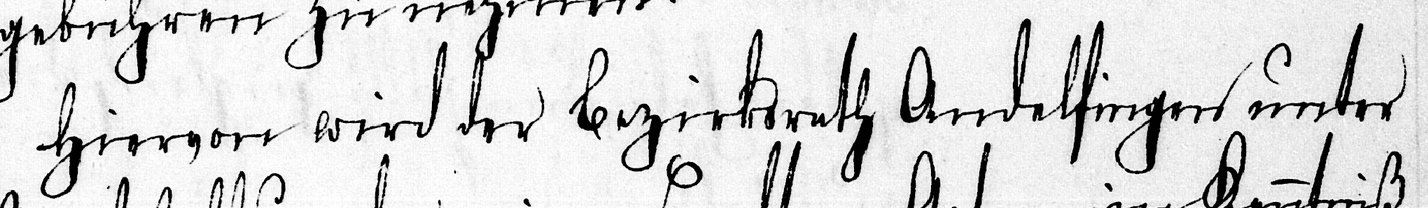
Hiervon wird der Bezirksrath Andelfingen unter
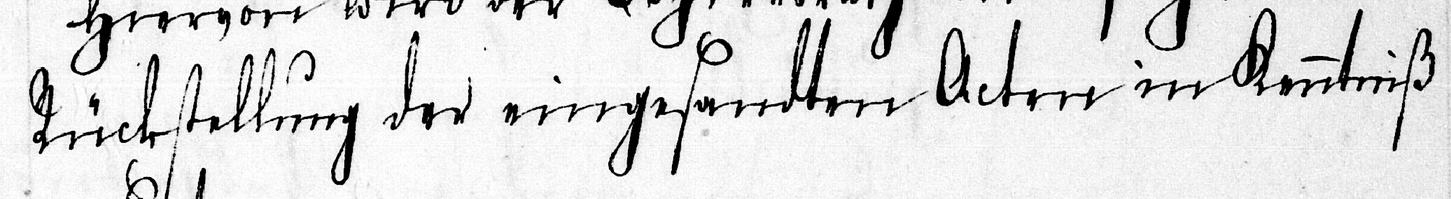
Rückstellung der eingesandten Acten in Kenntniß
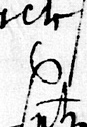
1.
